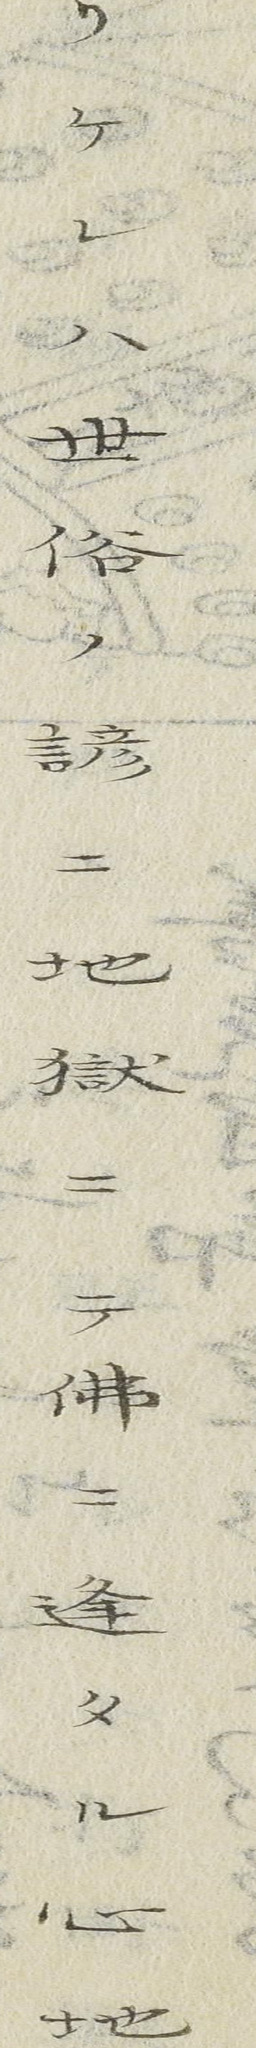リケレハ世俗ノ諺ニ地獄ニテ仏ニ逢タル心地
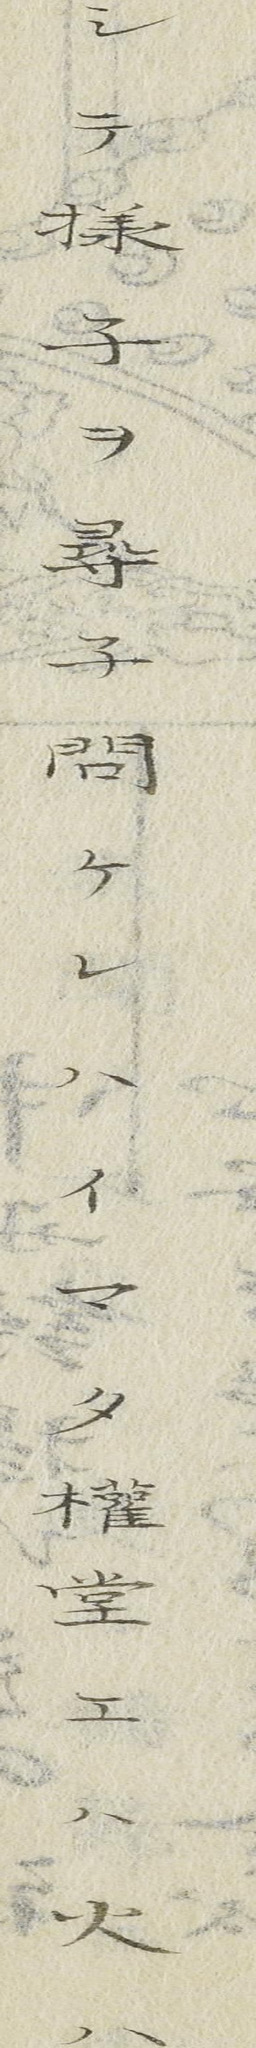シテ様子ヲ尋子問ケレハイマタ権堂エハ火ハ
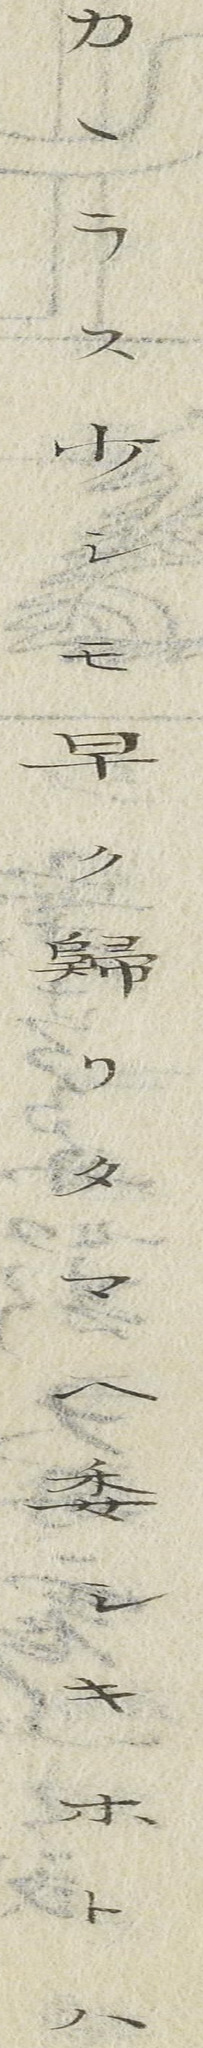カヽラス少シモ早ク帰リタマヘ委シキホトハ
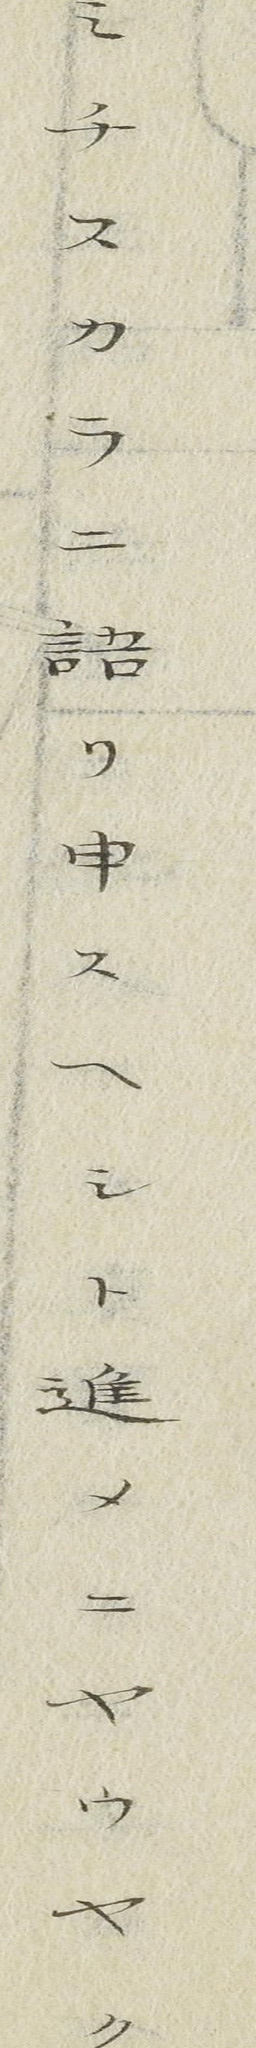ミチスカラニ語リ申スヘシト進メニヤウヤク
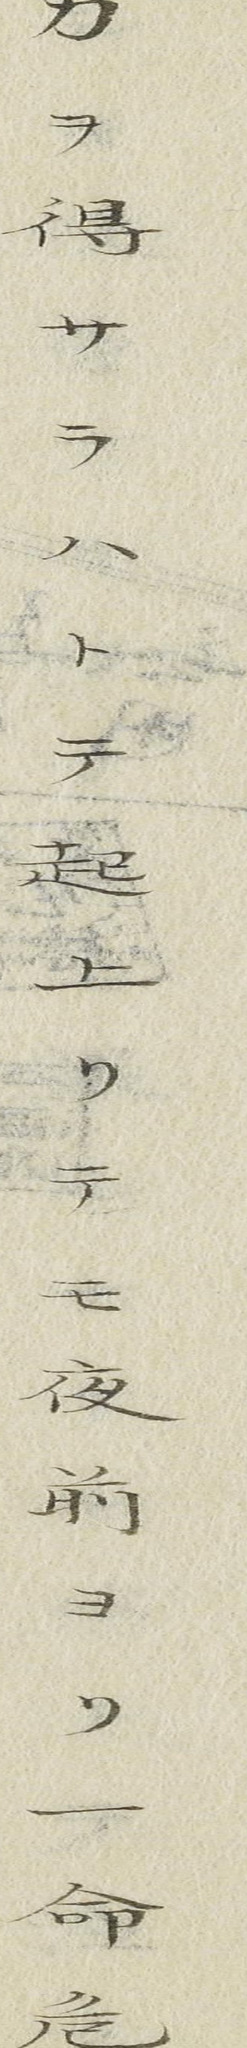力ヲ得サラハトテ起上リテモ夜前ヨリ一命危
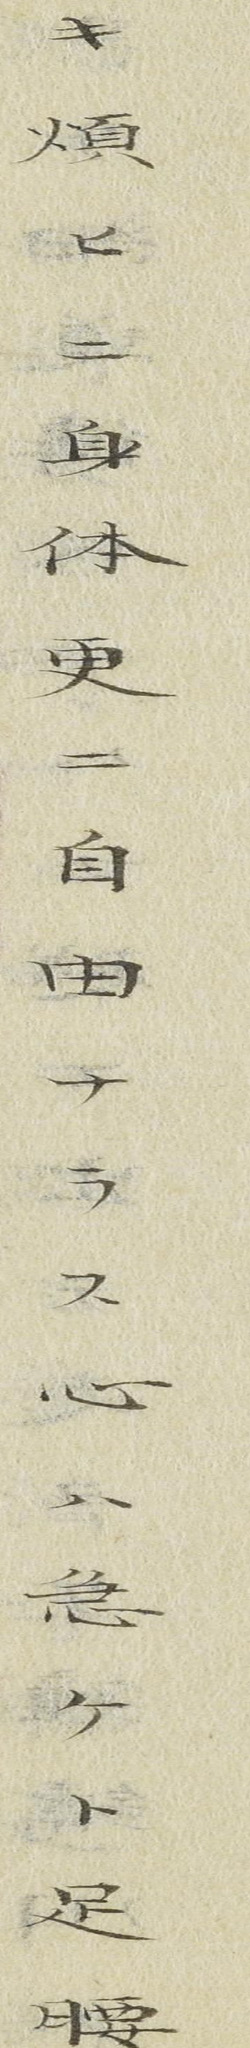キ煩ヒニ身体更ニ自由ナラス心ハ急ケト足腰
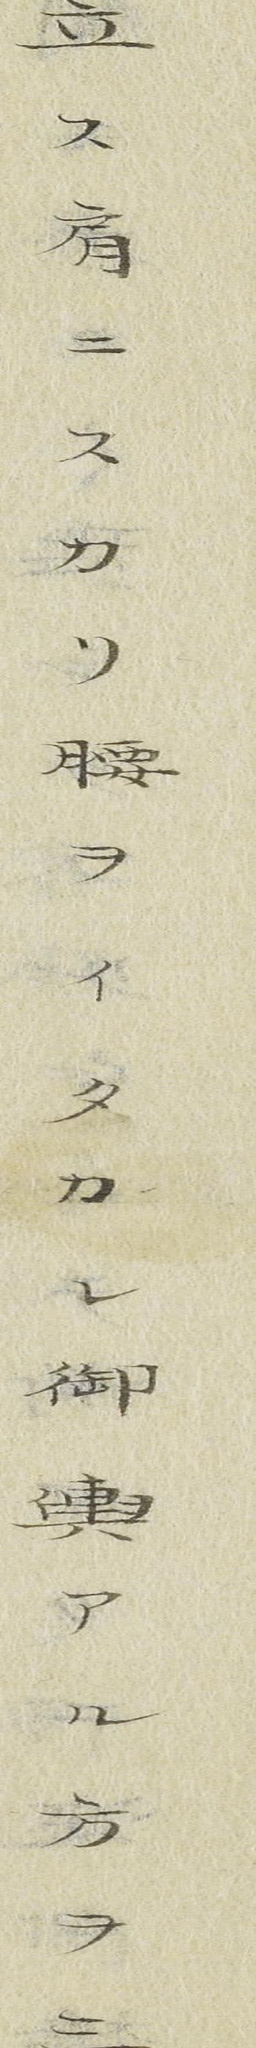立ス肩ニスカリ腰ヲイタカレ御輿アル方ヲ三
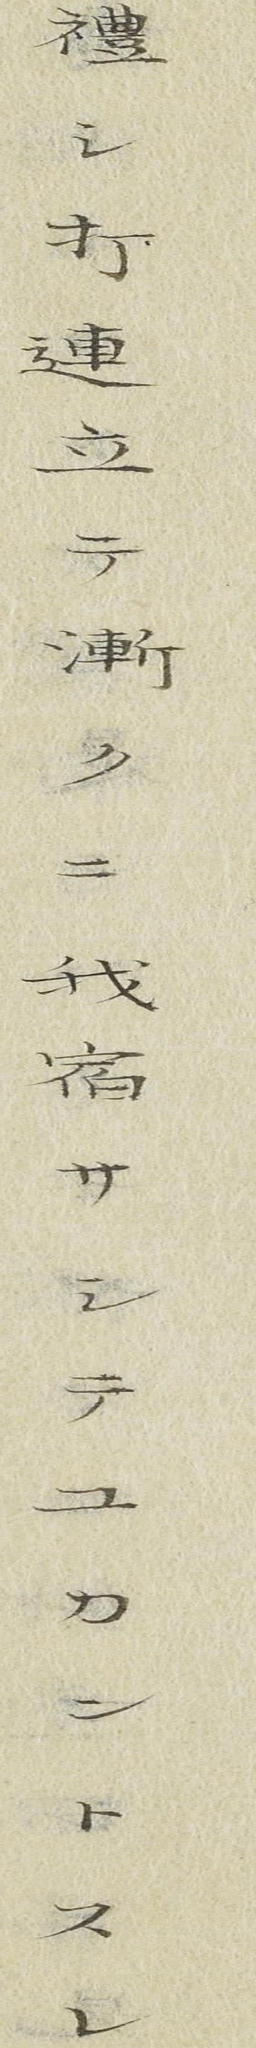礼シ打連立テ漸クニ我宿サシテユカントスレ
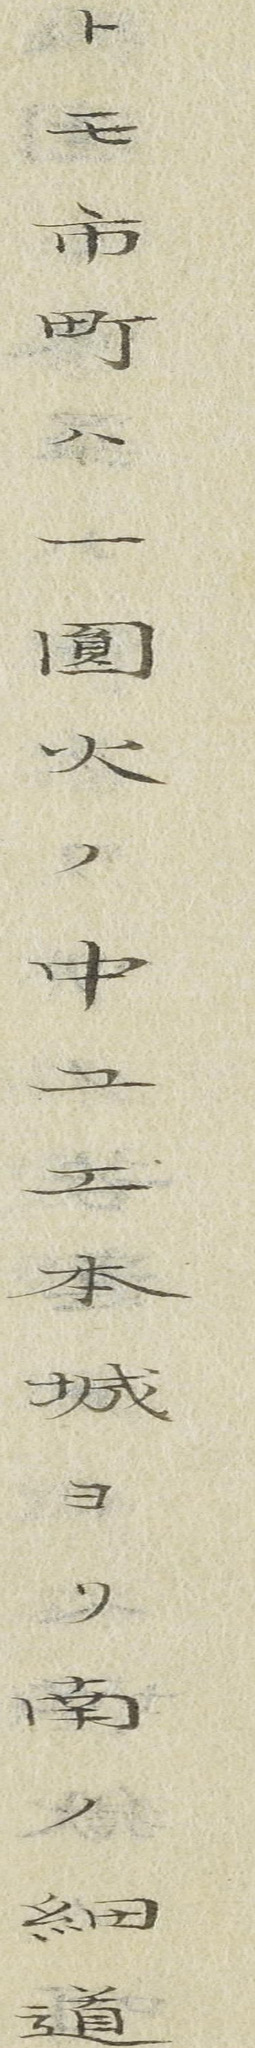トモ市町ハ一円火ノ中ユエ本城ヨリ南ノ細道
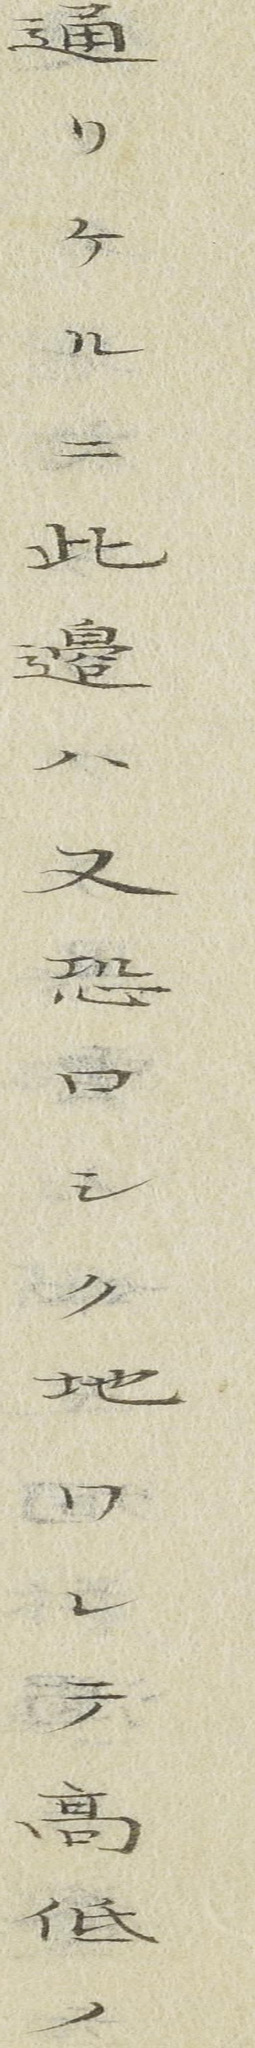通リケルニ此辺ハ又恐ロシク地ワレテ高低ノ
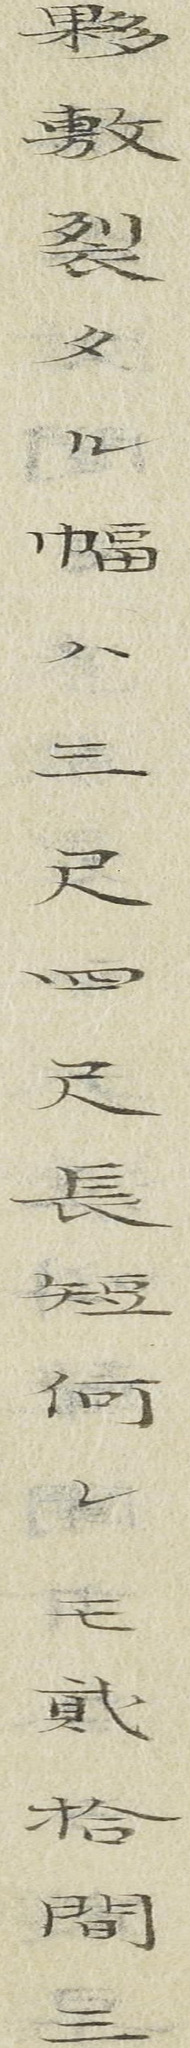夥敷裂タル幅ハ三尺四尺長短何レモ弐拾間三
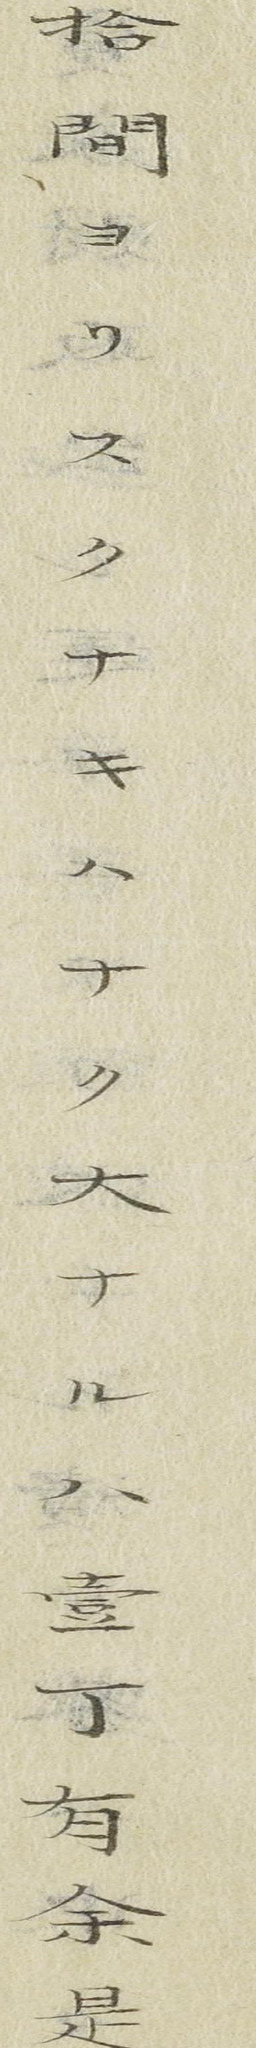拾間ヨリスクナキハナク大ナルハ壱丁有余是
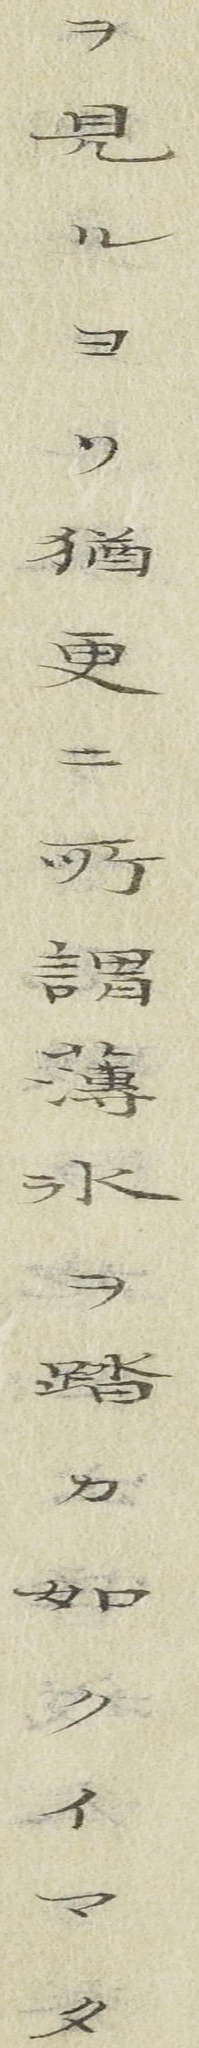ヲ見ルヨリ猶更ニ所謂薄氷ヲ踏カ如クイマタ
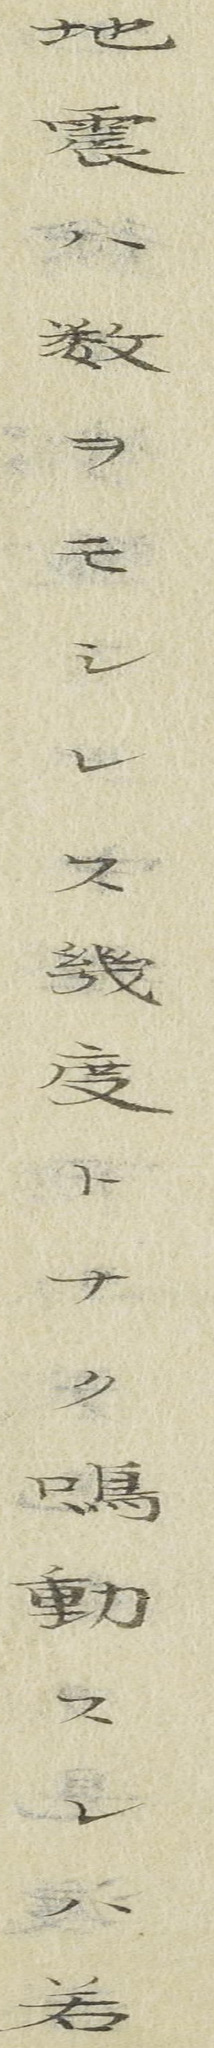地震ハ数ヲモシレス幾度トナク鳴動スレハ若
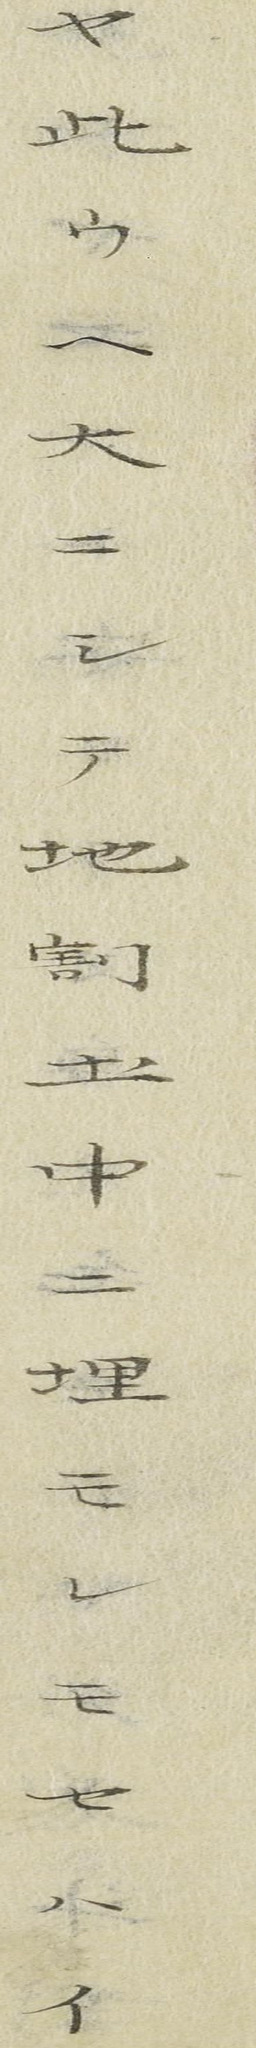ヤ此ウヘ大ニシテ地割土中ニ埋モレモセハイ

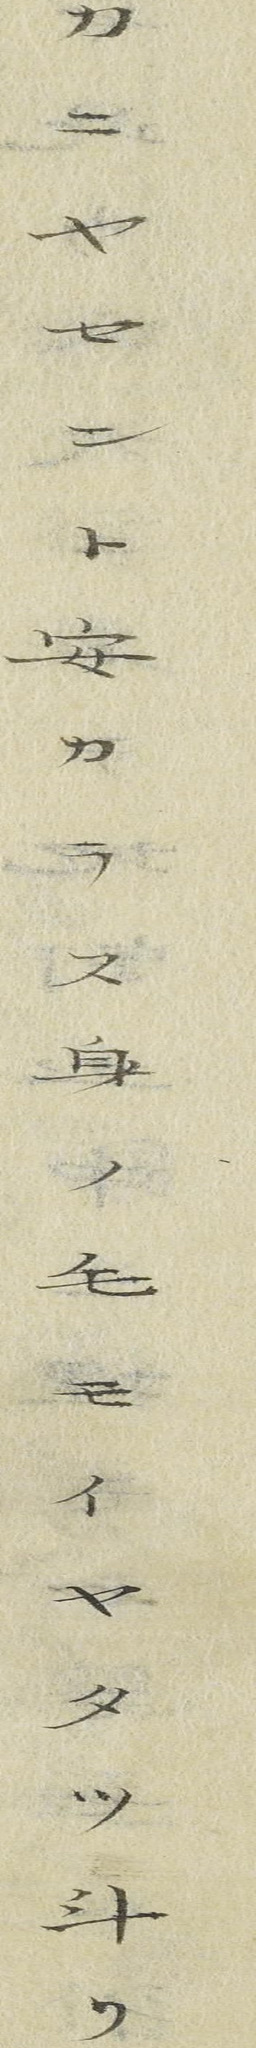カニヤセント安カラス身ノ毛モイヤタツ斗リ
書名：地災撮要　地震之部　巻ノ二
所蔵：東京大学地震研究所図書室 Earthquake Research Institute Library, The University of Tokyo, JAPAN
